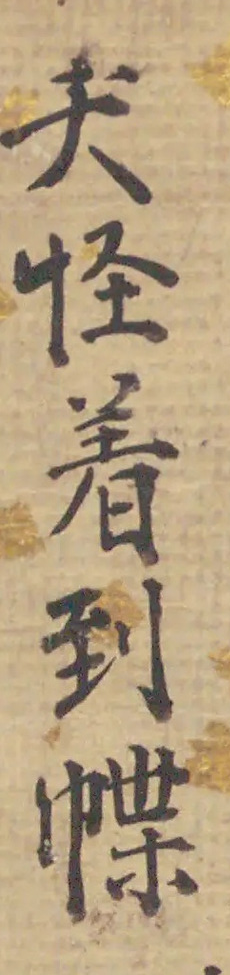夭怪着到牒
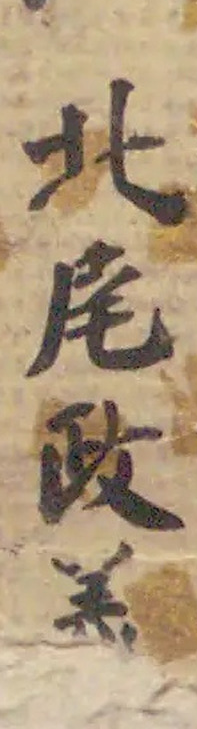北尾政美

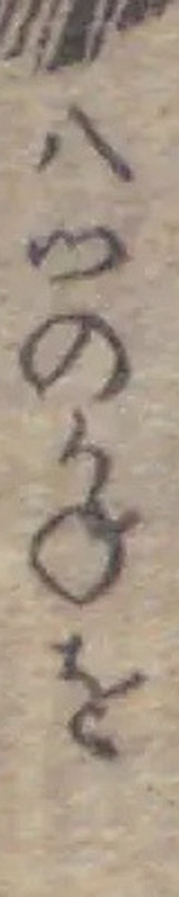八つのかねを
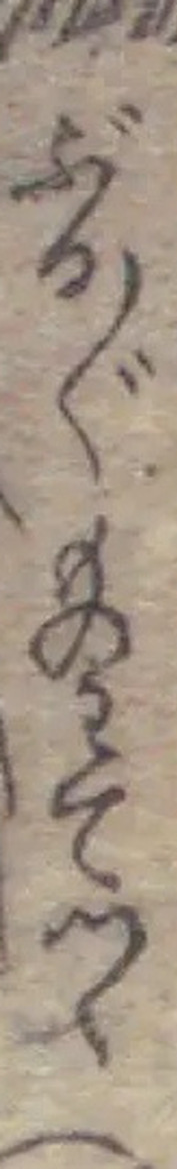ぶる〴〵ものにてつく
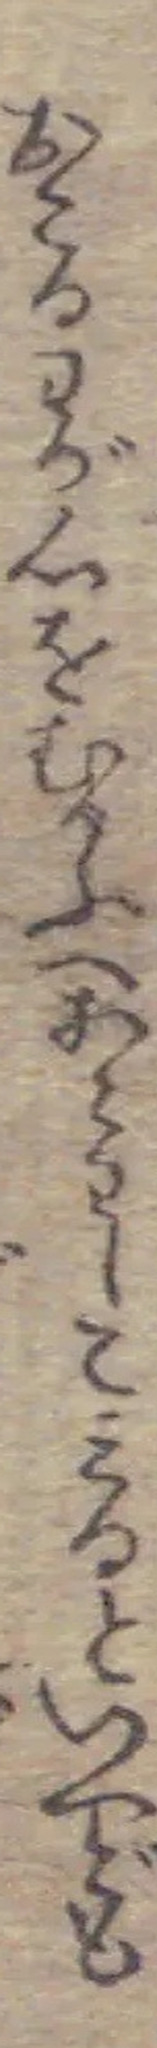おこるわが心をむかふへあらわしてみるといへども
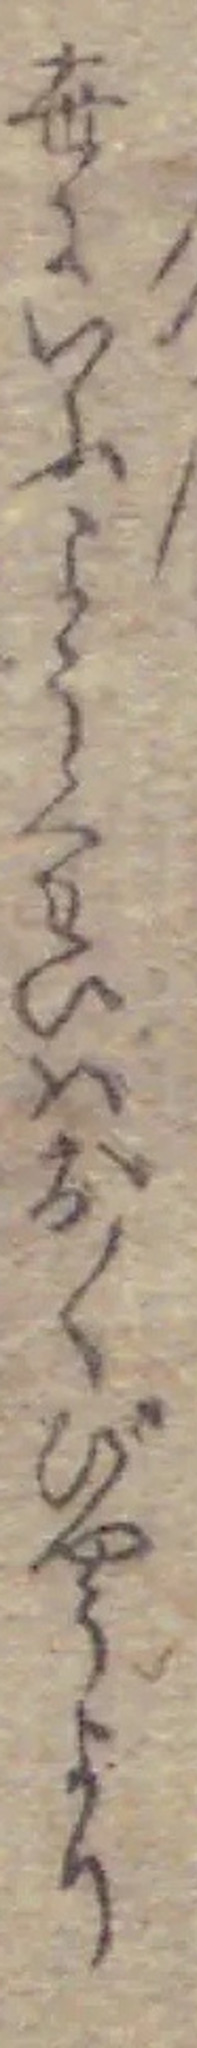世にいふようくわいはおくびやうより
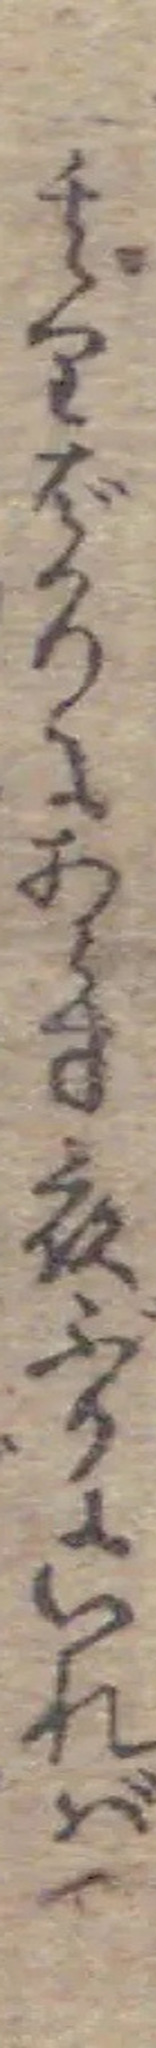其りばかりにあらす夜ぶかにいれば
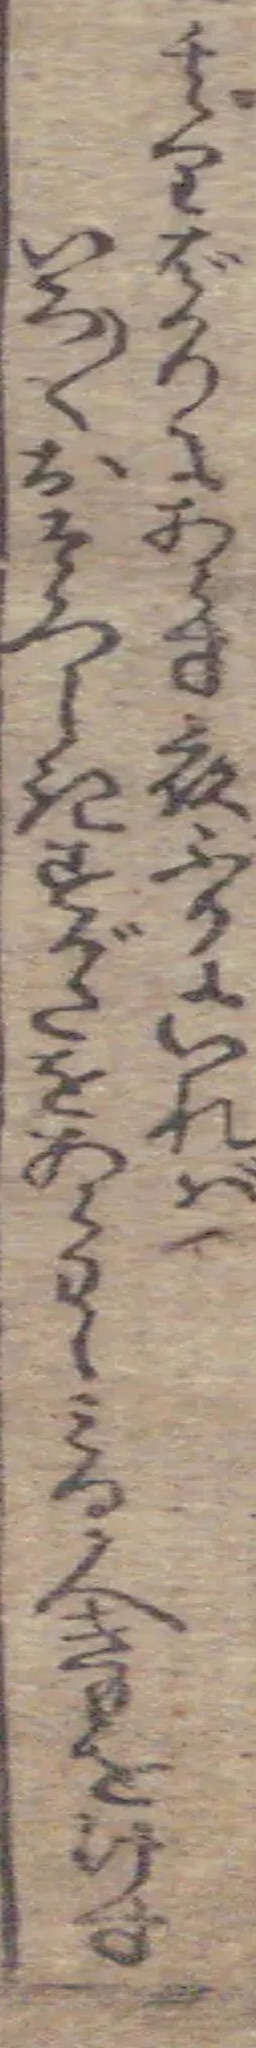いろ〳〵おそろしきすがたをあらわしみる人きもをけす

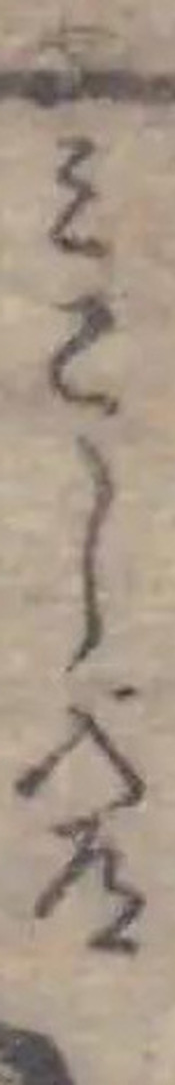みこし入道
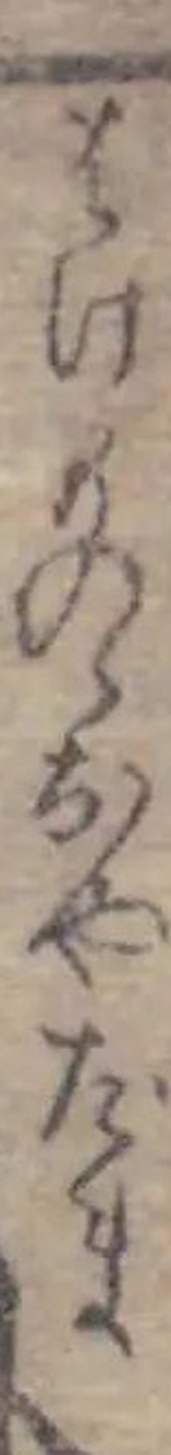はけものゝおやだま
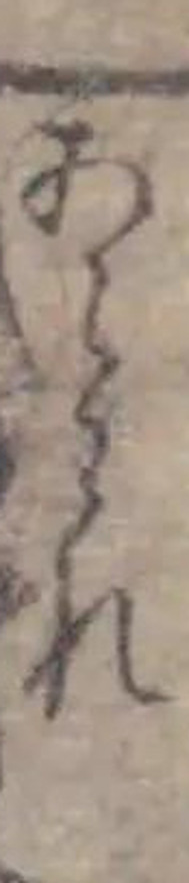あらわれ
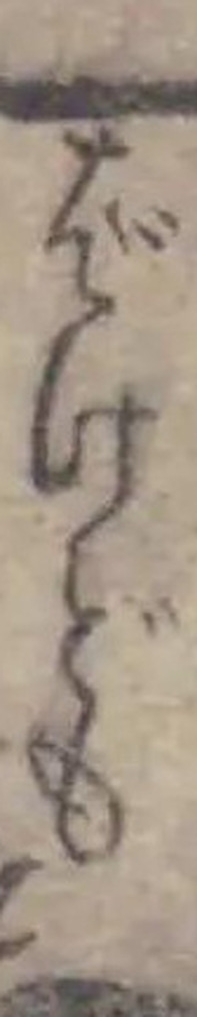ばけどもを
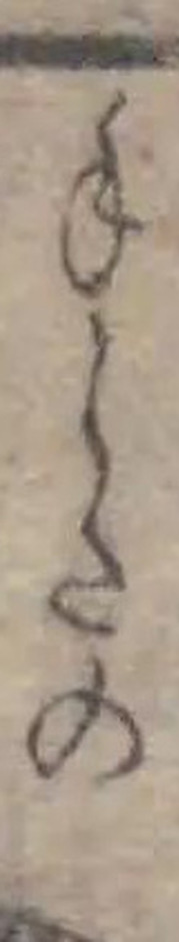てしたの
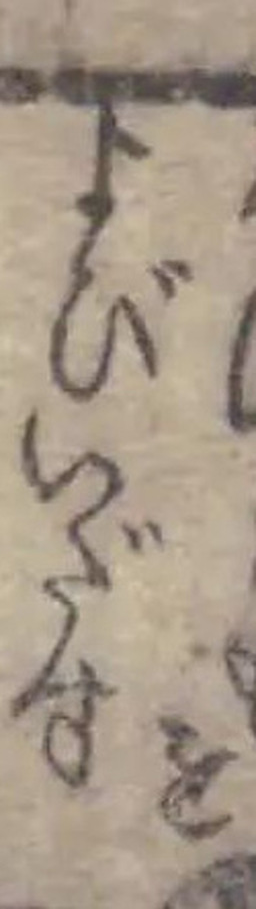よびいだす
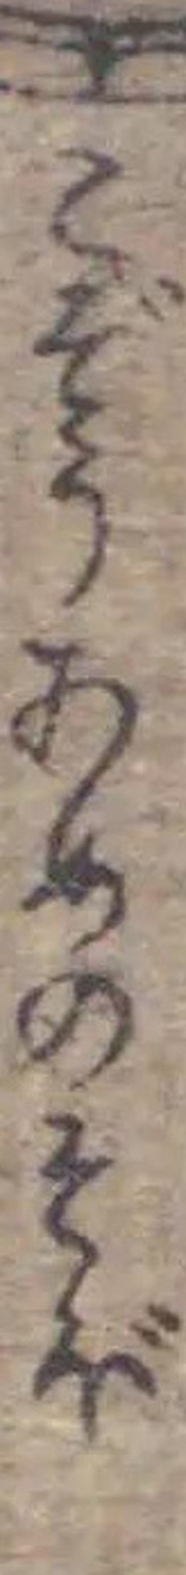こぞうあめのそぼ
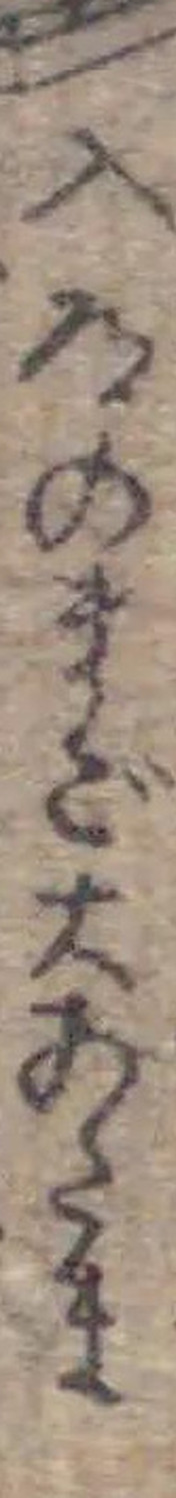入道のまご大あたま
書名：夭怪着到牒 2巻
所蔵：国立国会図書館 National Diet Library, JAPAN
